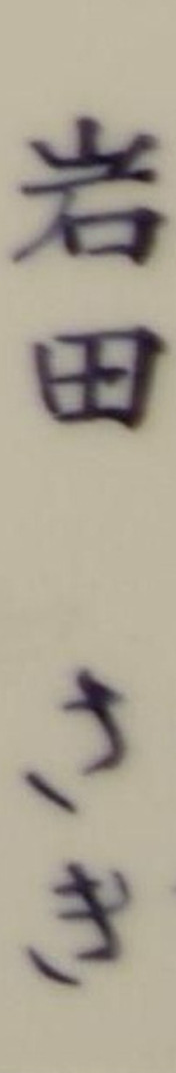岩田さき
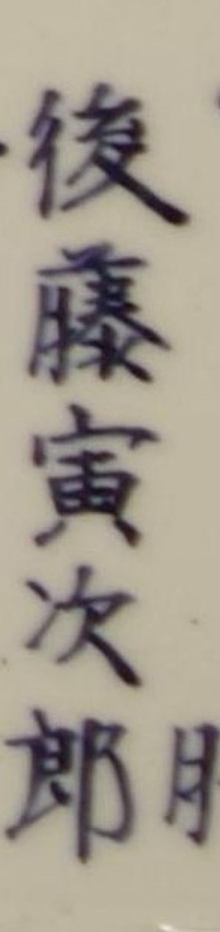後藤寅次郎
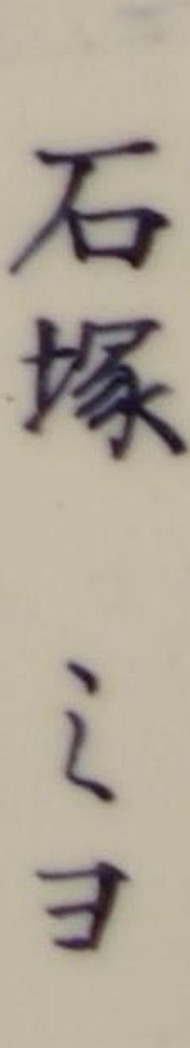石塚ミヨ
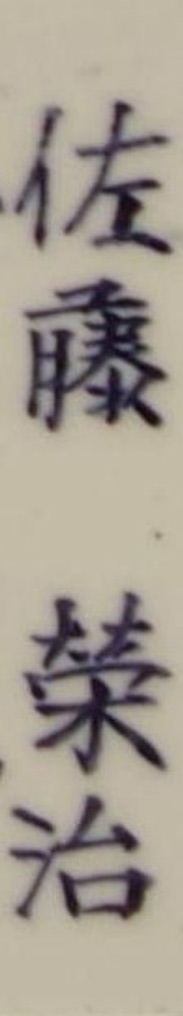佐藤榮治
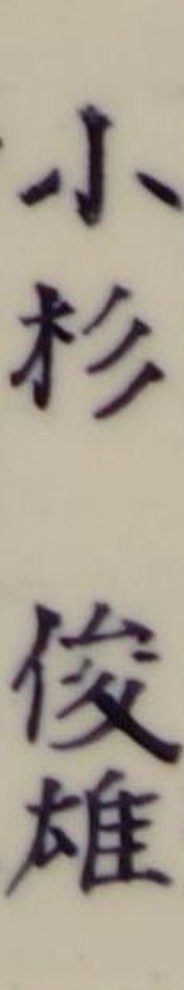小杉俊雄
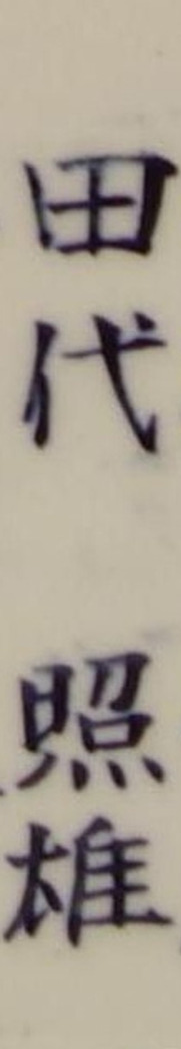田代照雄
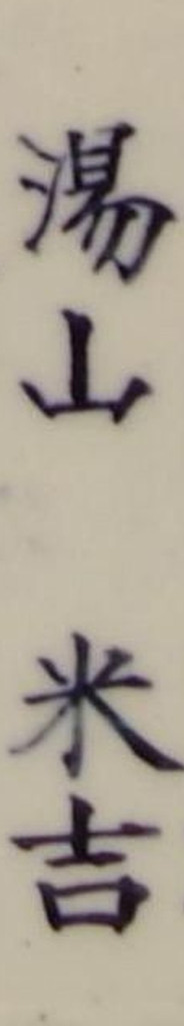湯山米吉
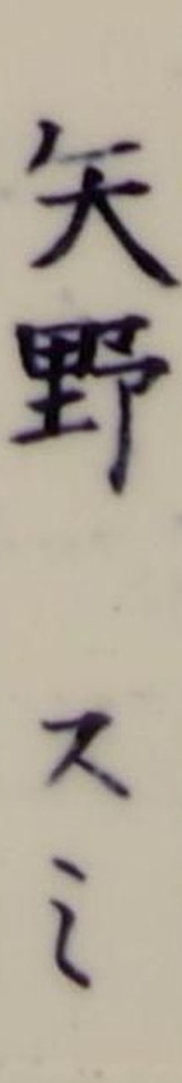矢野スミ
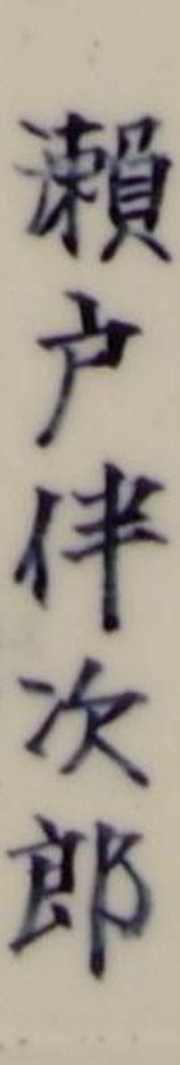瀬戸伴次郎
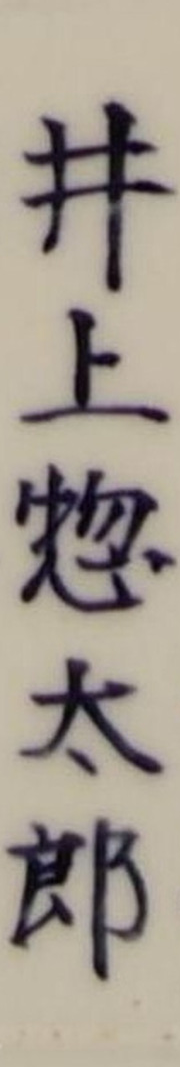井上惣太郎
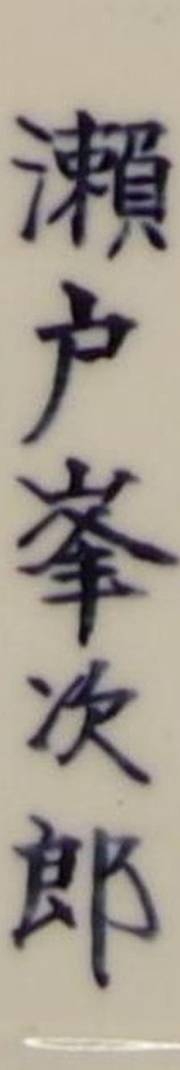瀬戸峯次郎
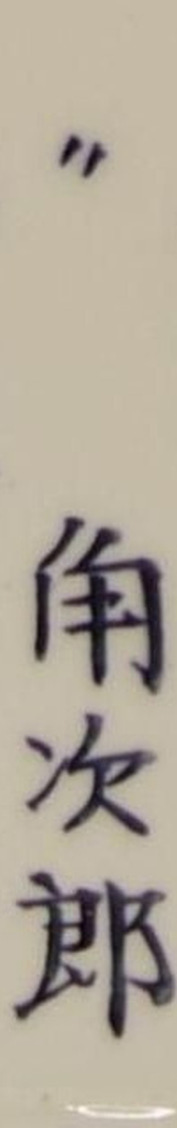角次郎
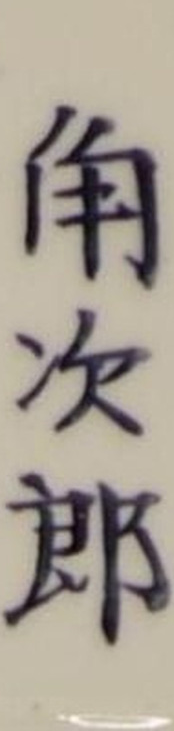角次郎
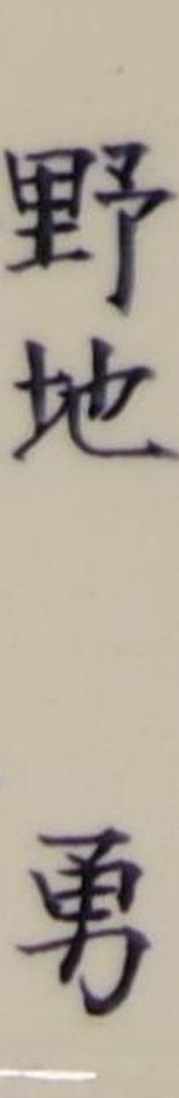野地勇
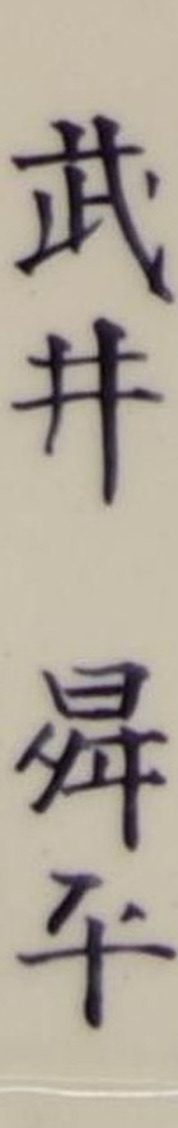武井昇平

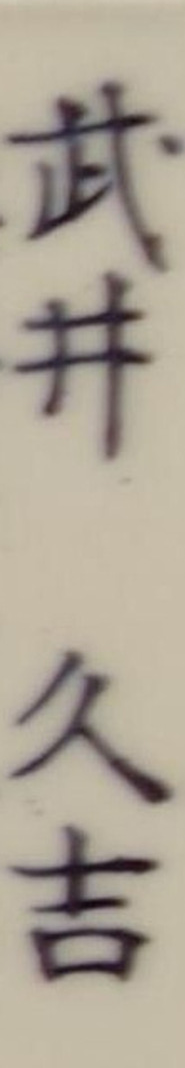武井久吉
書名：E~L
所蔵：高野山金剛峯寺
